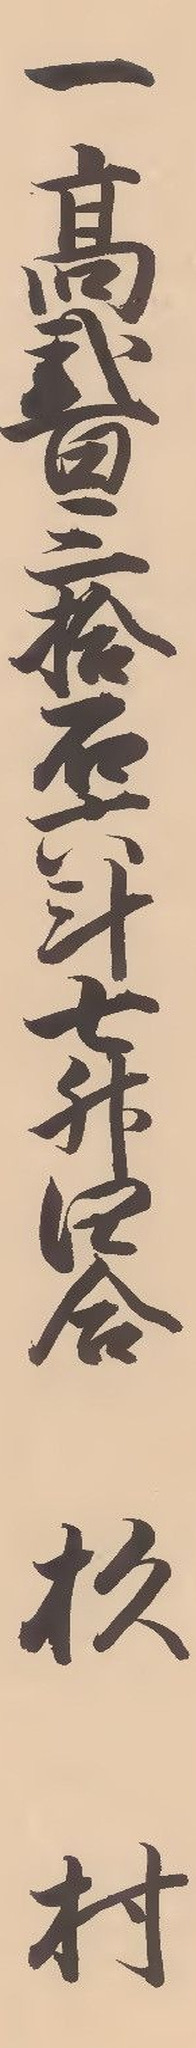一高弐百三拾石六斗七升四合杉村
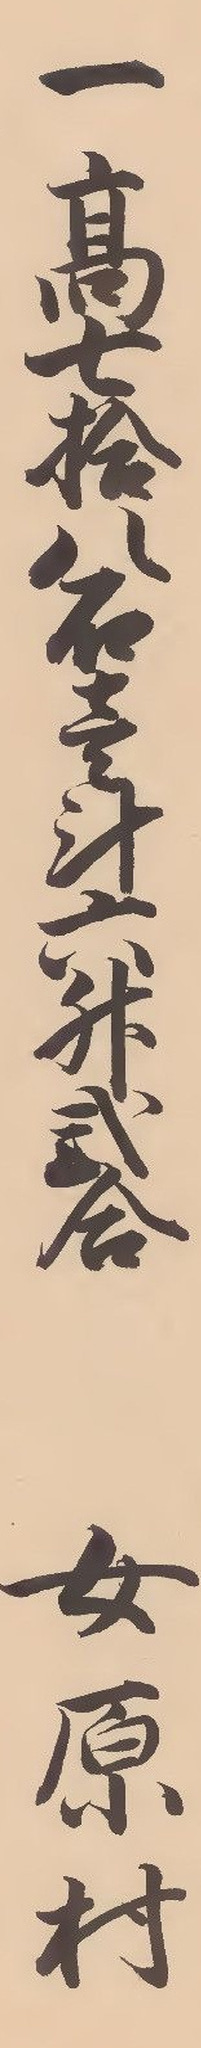一高七拾八石壱斗六升弐合女原村
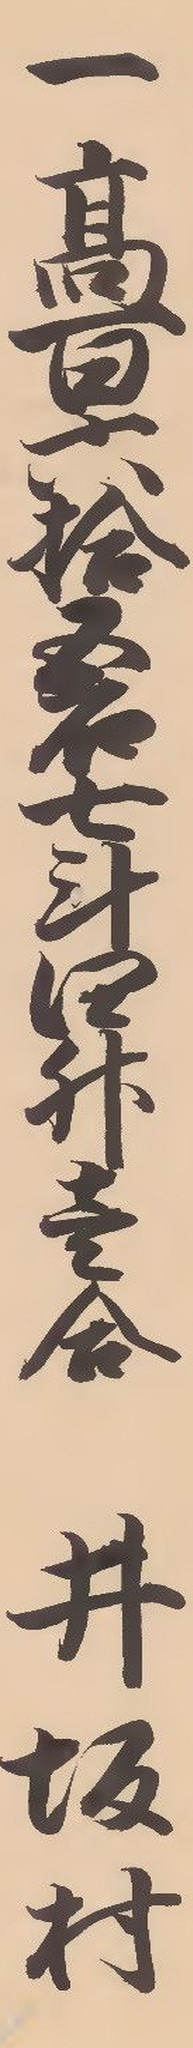一高百六拾五石七斗四升壱合井坂村
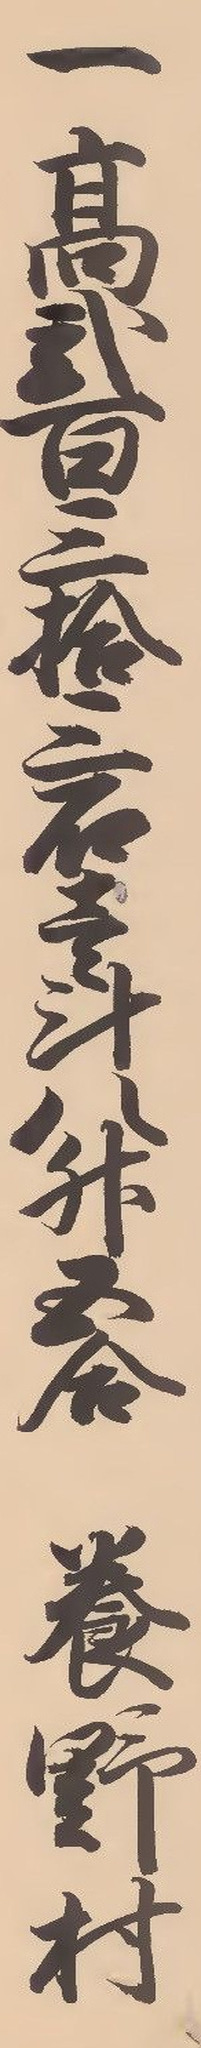一高弐百三拾三石壱斗八升五合養野村
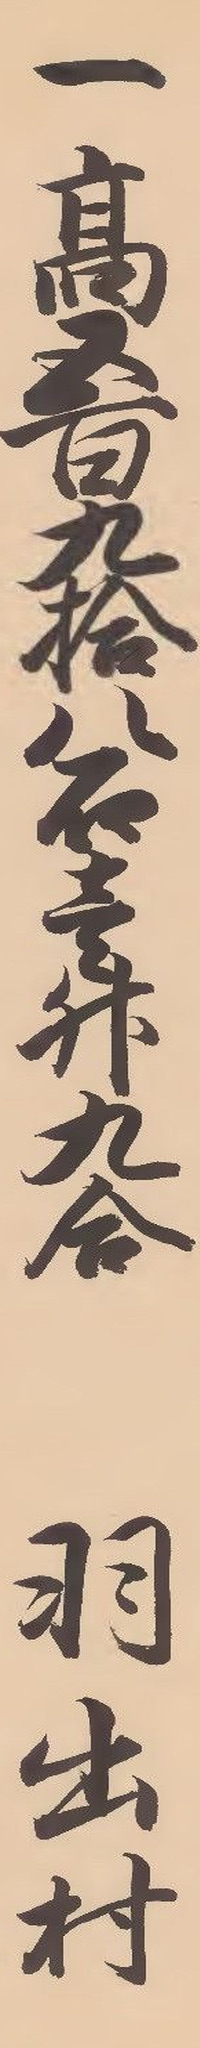一高五百九拾八石壱升九合羽出村
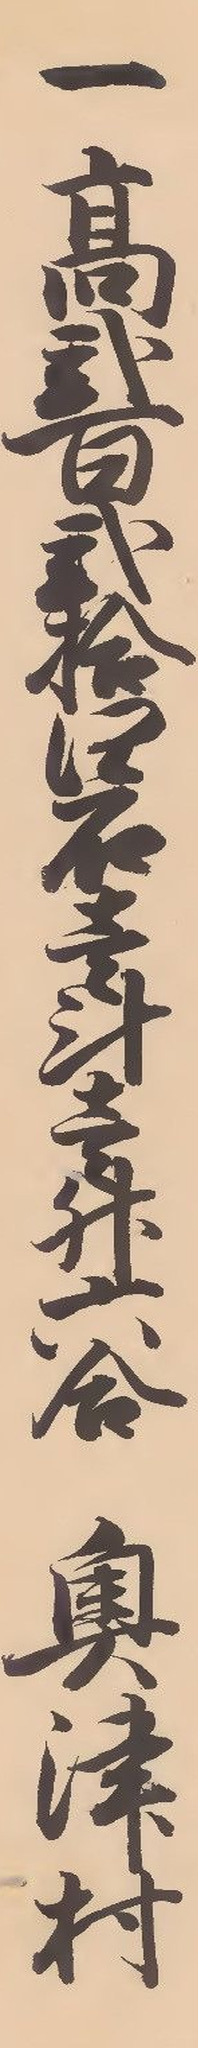一高弐百弐拾四石壱斗壱升六合奥津村

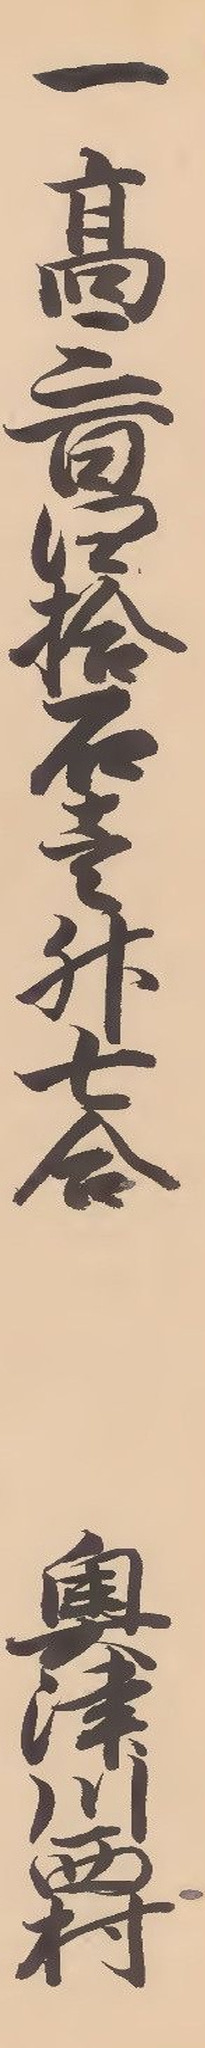一高三百四拾石壱升七合奥津川西村
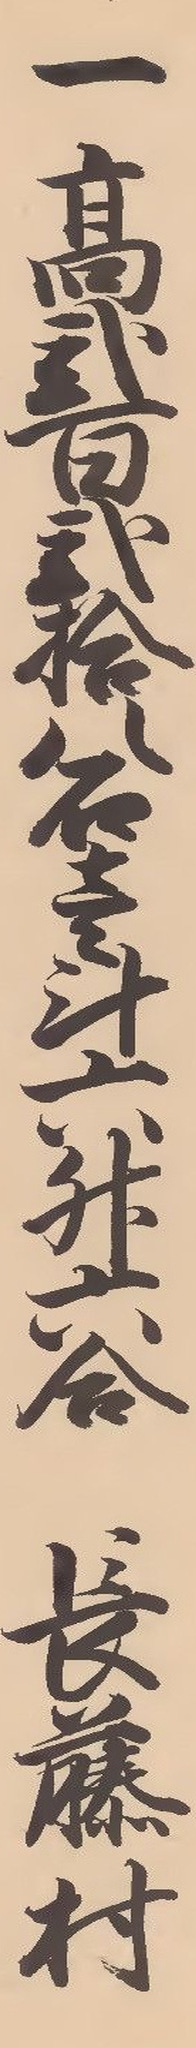一高弐百弐拾八石壱斗六升六合長藤村
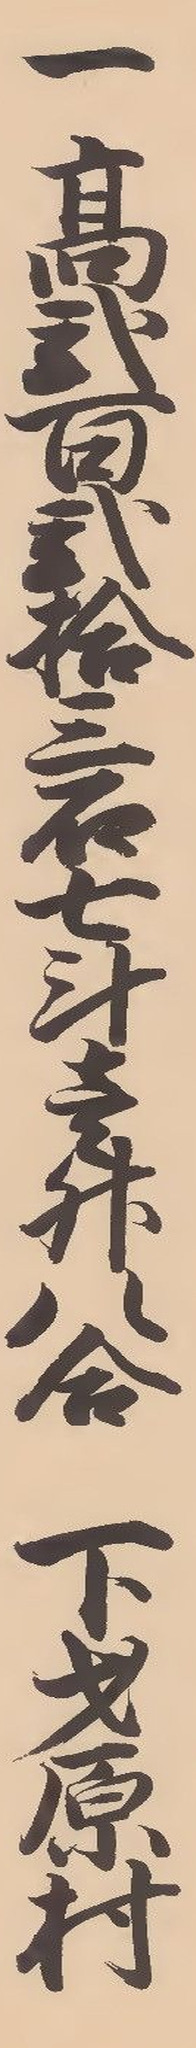一高弐百弐拾三石七斗壱升八合下才原村
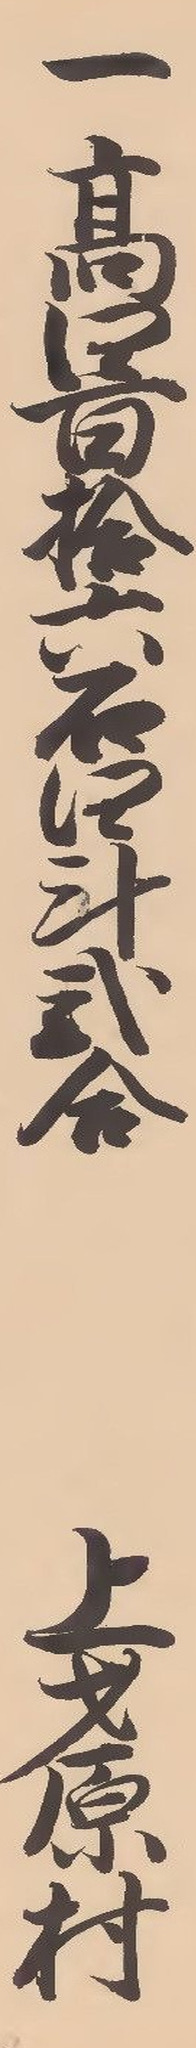一高四百拾六石四斗弐合上才原村
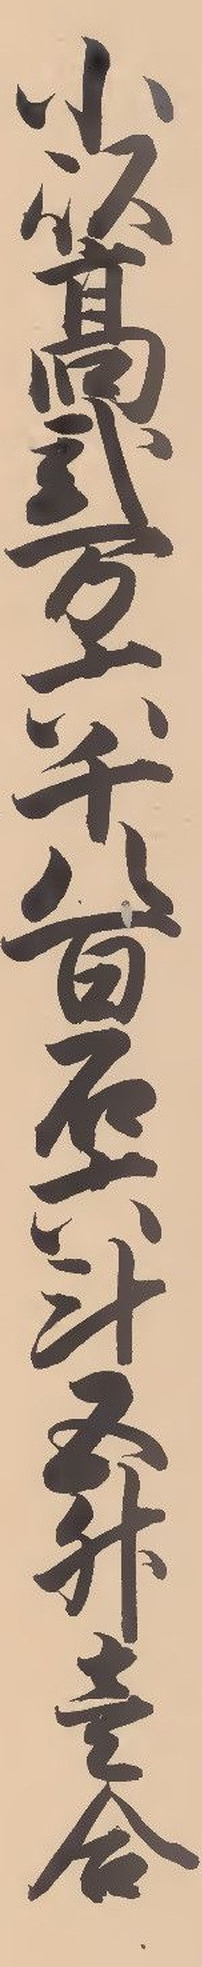小以高弐万六千八百石六斗五升壱合

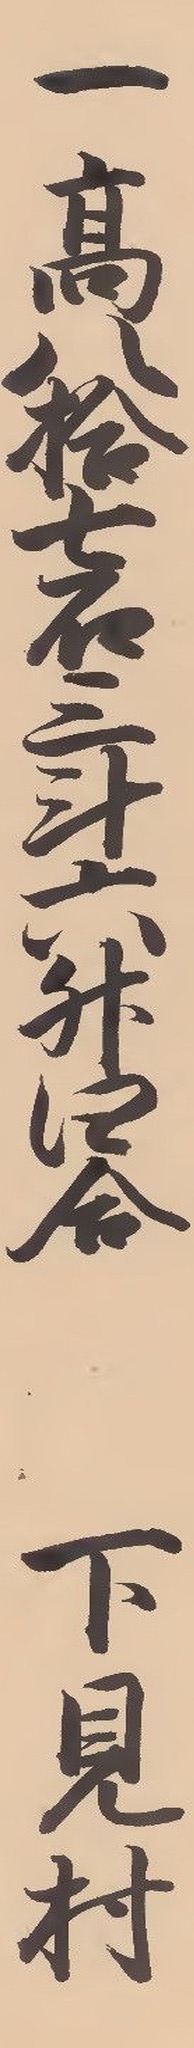一高八拾七石三斗六升四合下見村
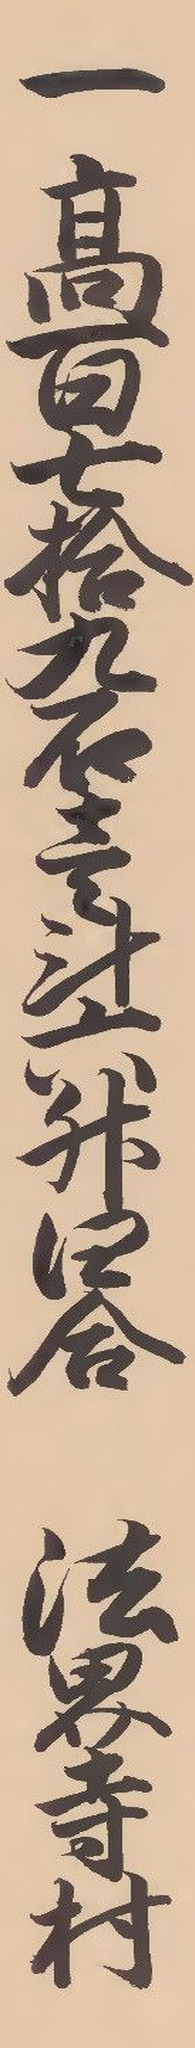一高百七拾九石壱斗六升四合法界寺村
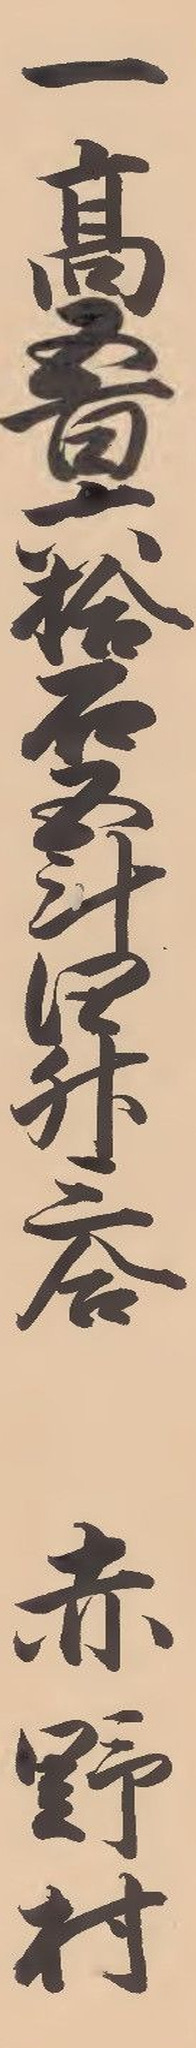一高五百六拾石五斗四升三合赤野村
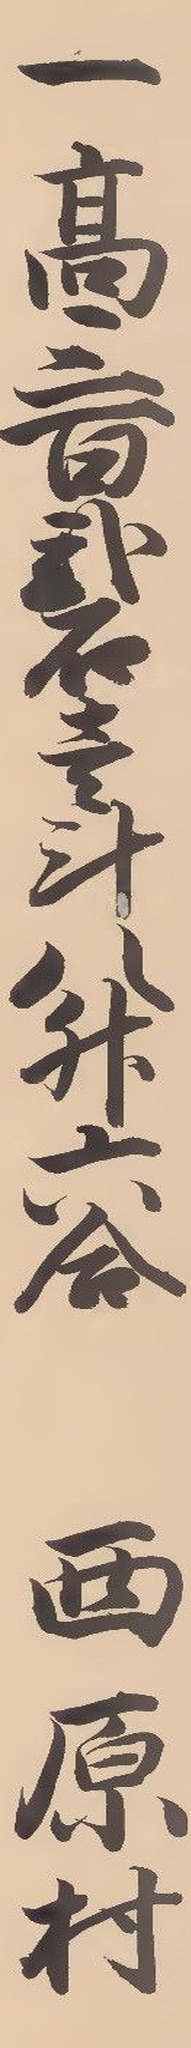一高三百弐石壱斗八升六合西原村
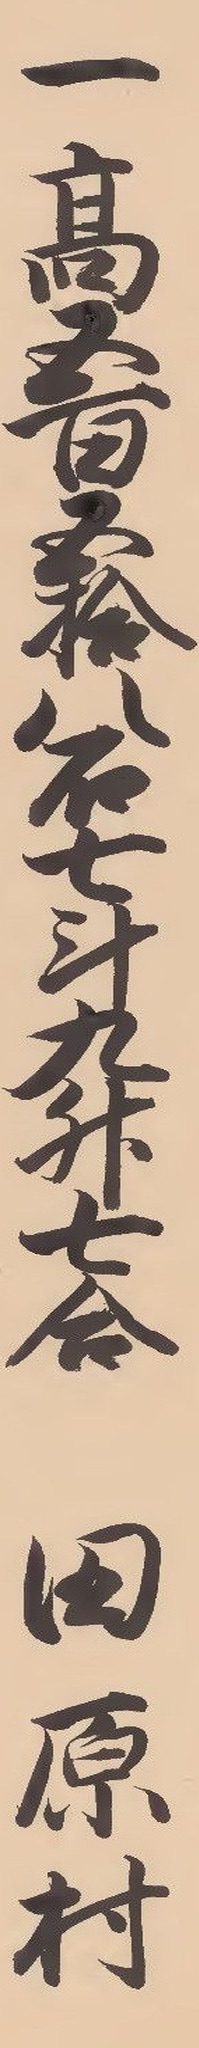一高五百五拾八石七斗九升七合田原村
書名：美作国郷帳
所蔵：国立公文書館 National Archives of Japan
